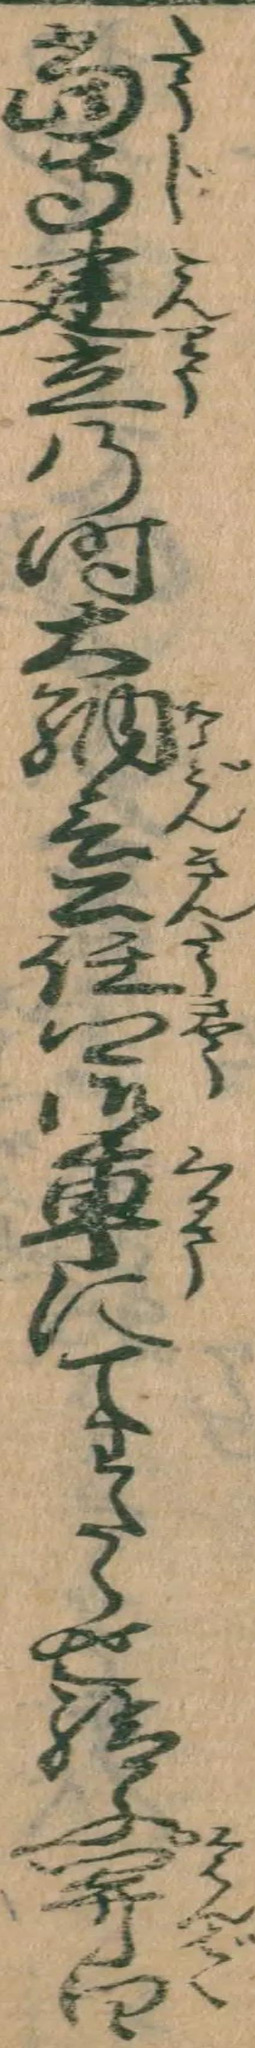当寺建立の時大納言公任卿御車にてわたらせ給ふ。関白
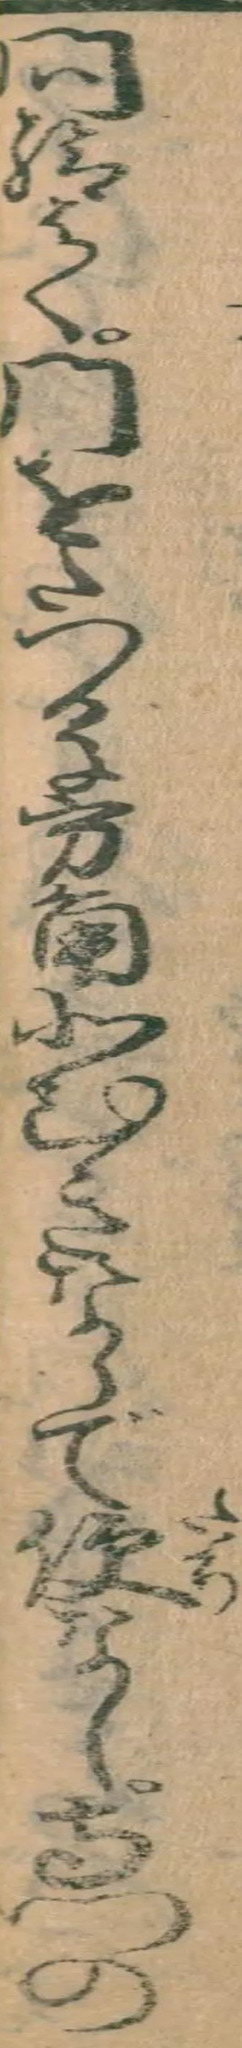問給はく。門をたつるに方角北むきならで便なし。寺門の
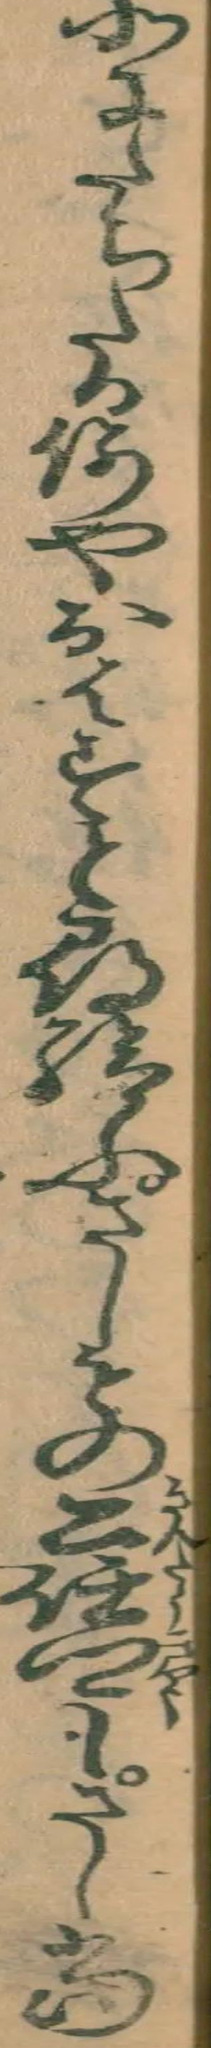北にたちたる例やおはすと尋給ふ。さしもの公任卿も。さし当
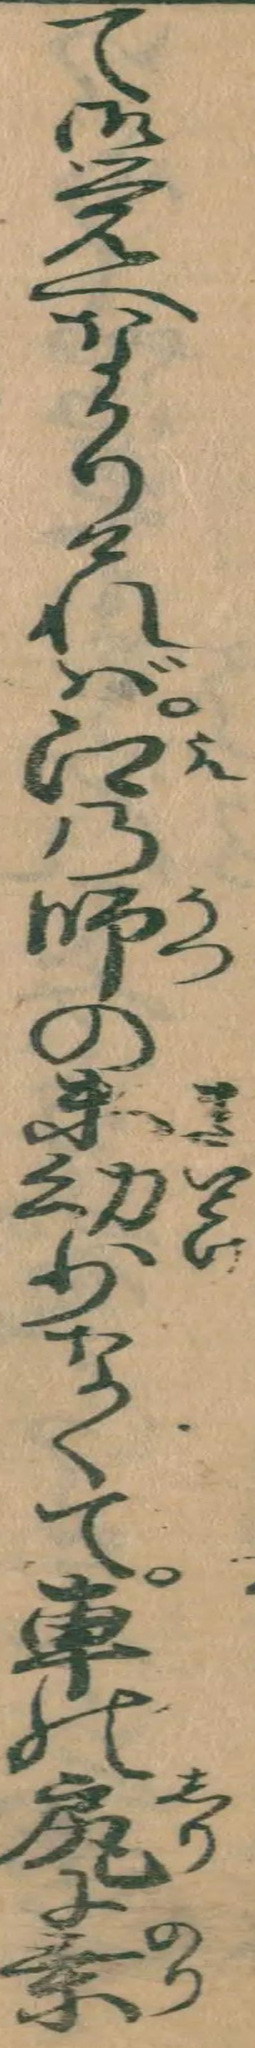て御覚へなかりければ。江の師の未幼少なくて。車の尻に乗
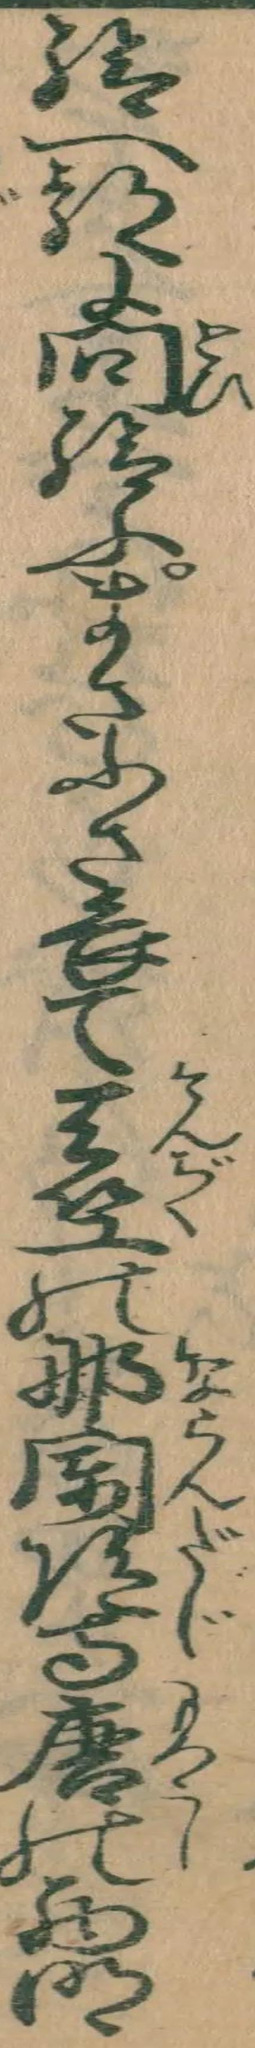給へるに問給ふ。まさふさ畏て天竺の那䦨陀寺唐の西明
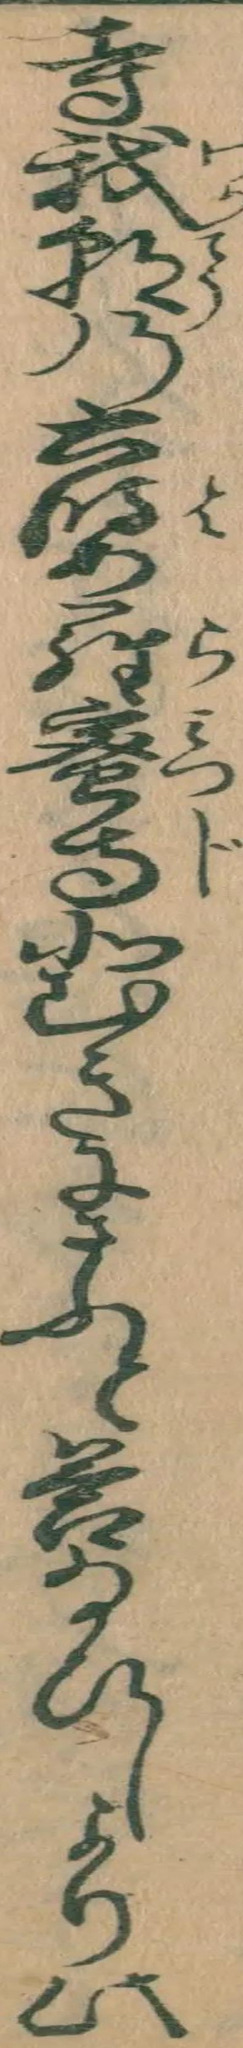寺我朝の六婆羅蜜寺北むきにさふと答給ひしより此
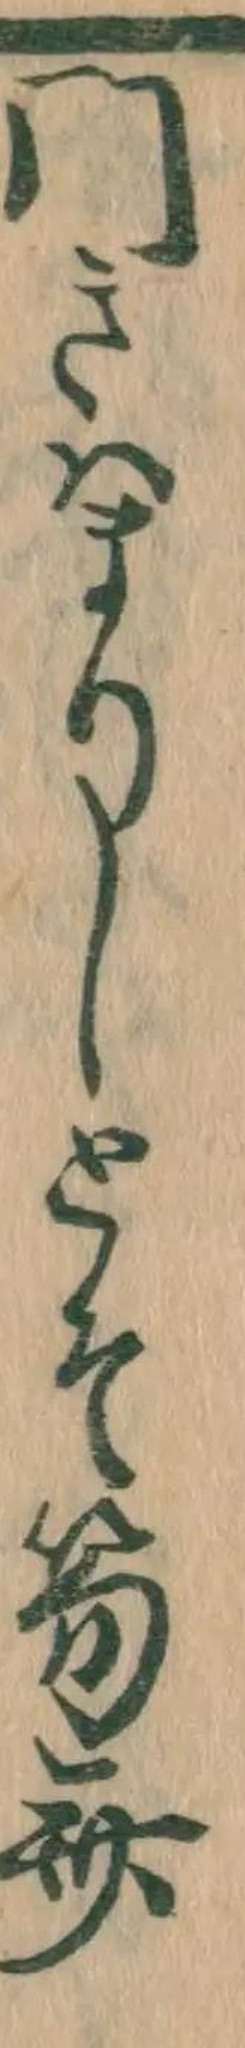門きはまりしとそ筍斎
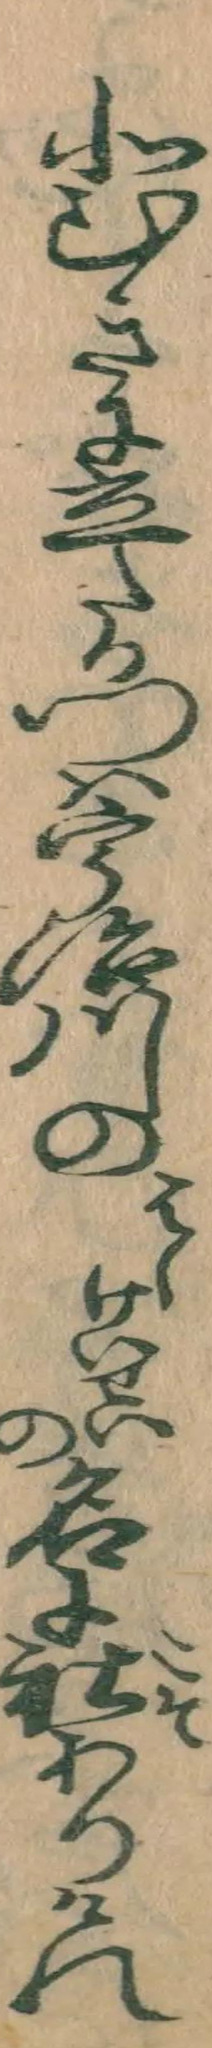北むきに立たる門は宇治川のはしけいせいの名に社ありけれ
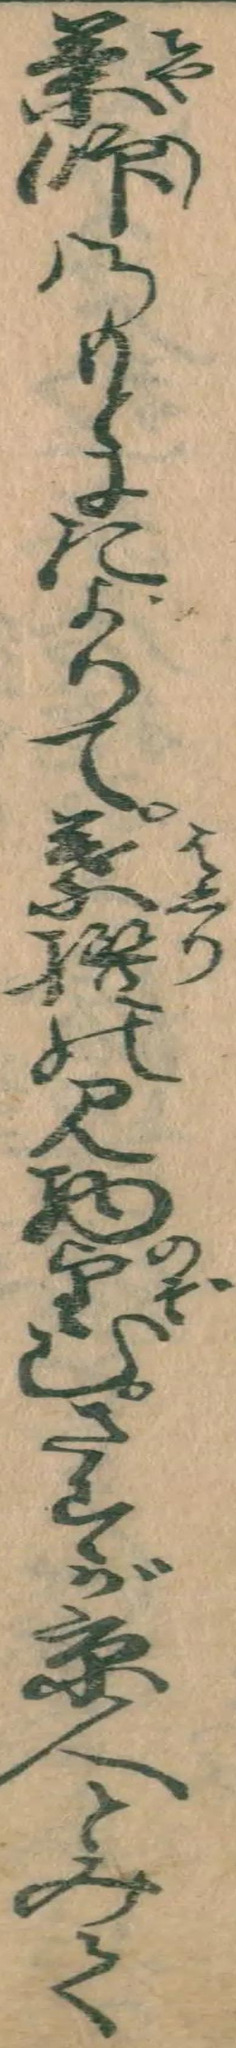茶師のもとにたよりて。葉撰の見物望む。さすが京人とみて
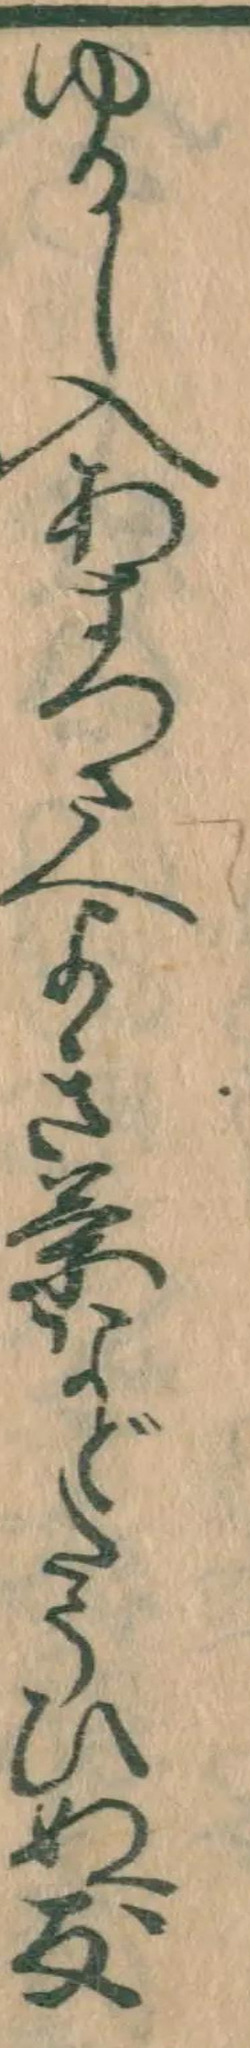ゆるし入あまつさへよき茶などたうひぬ友
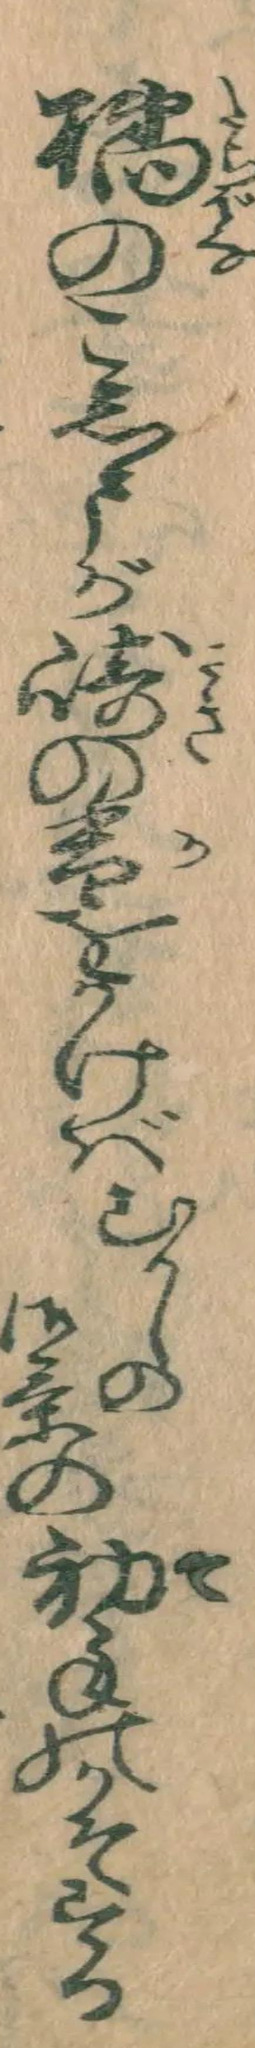橘のこしまが崎の香をかけばむかしの御茶の初手のかそする
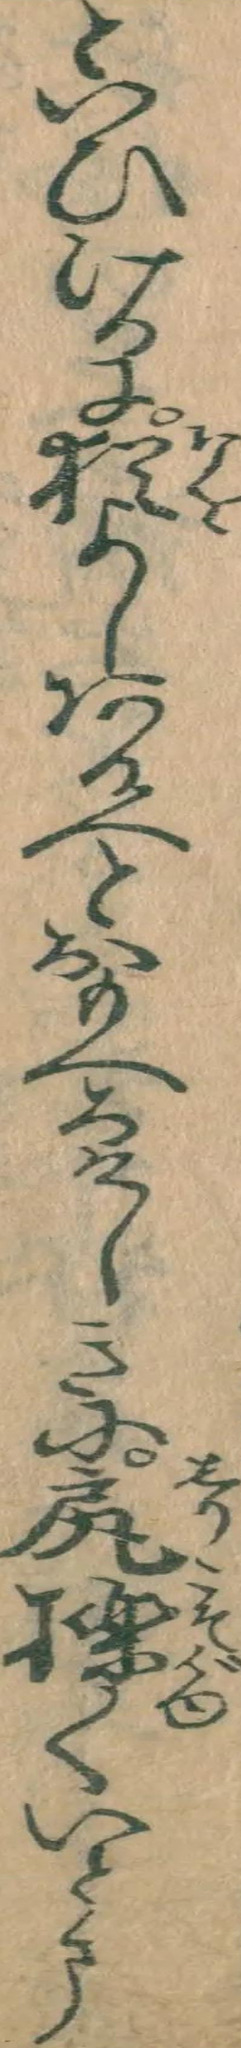といひけるに。猶よしある人とおもへるけしきに。尻擽くいとま
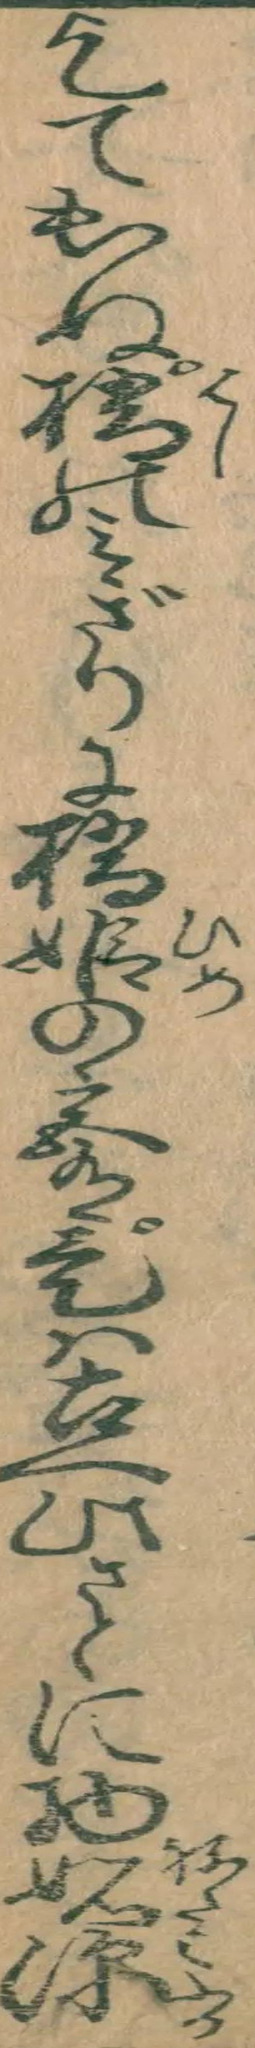乞て出ぬ。橋のみぎりに橋姫の宮有。是は古へ此さとに物妬深

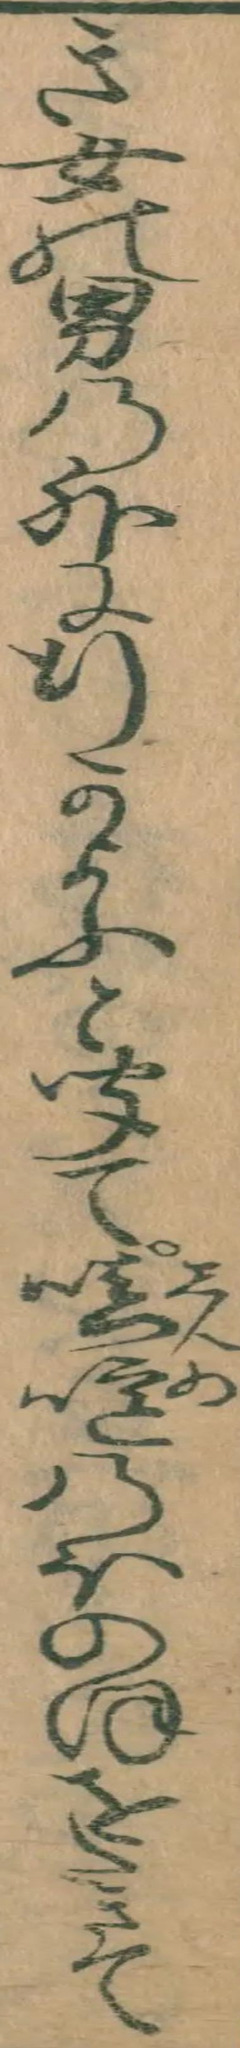き女の男の外に行かよふと聞て。嗔喧のほのほをたきて
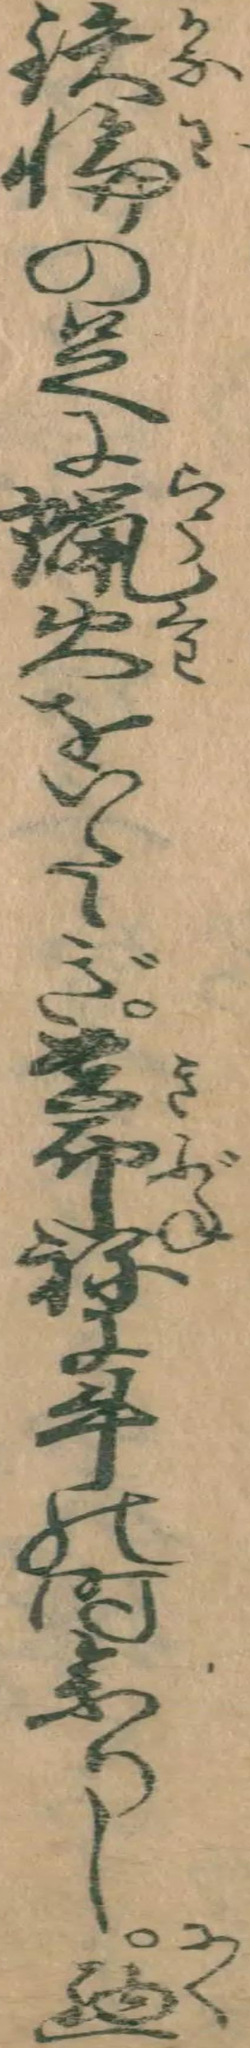鉄輪の足に猟火をいたゝぎ。貴布祢に牛の時参りし。悪
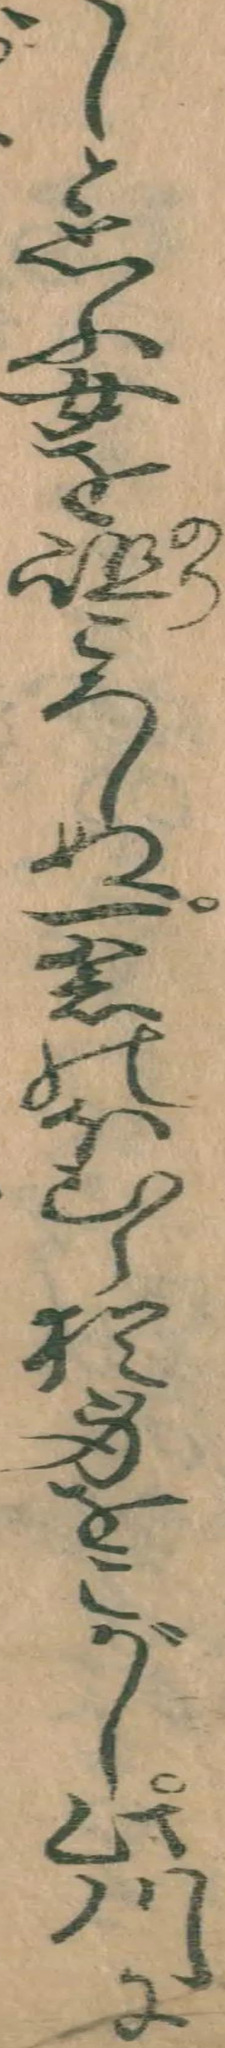しと思ふ女を詛ころしぬ。一念のほむら猶身をこがし。此川に
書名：新竹斎 5巻
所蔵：国立国会図書館 National Diet Library, JAPAN
